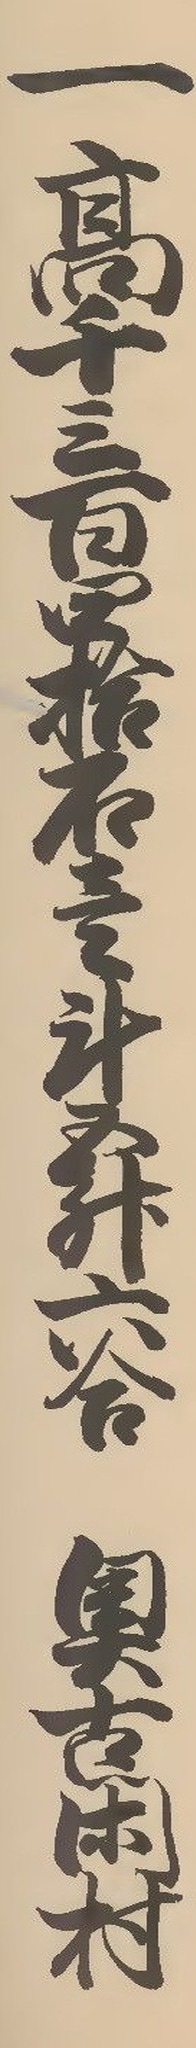一髙千三百四拾石壱斗五升六合奥古閑村
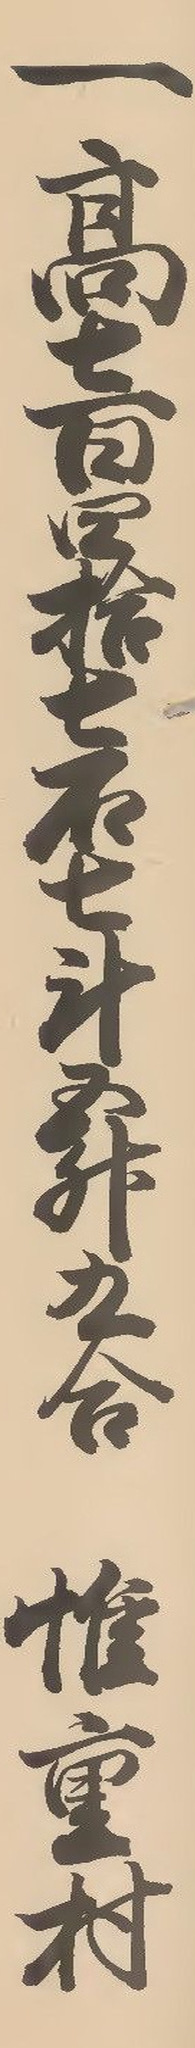一髙七百四拾七石七斗五升九合惟重村
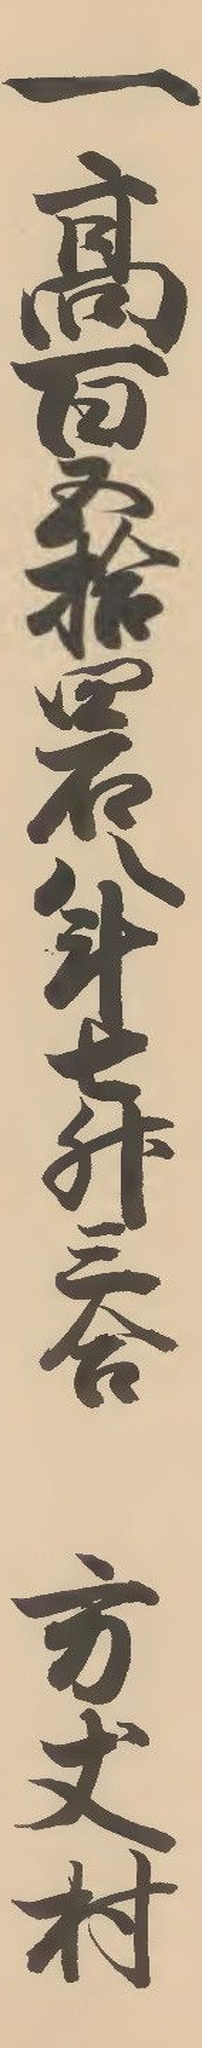一髙百五拾四石八斗七升三合方丈村
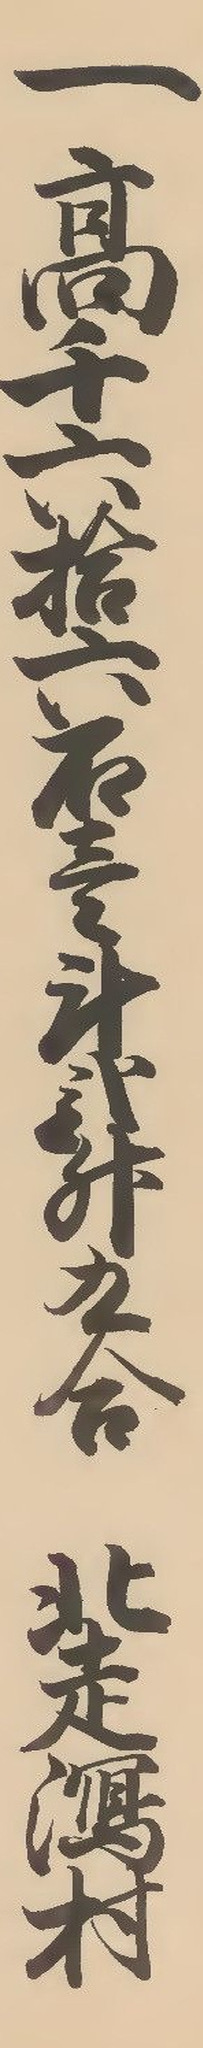一髙千六拾六石壱斗弐升九合北走潟村
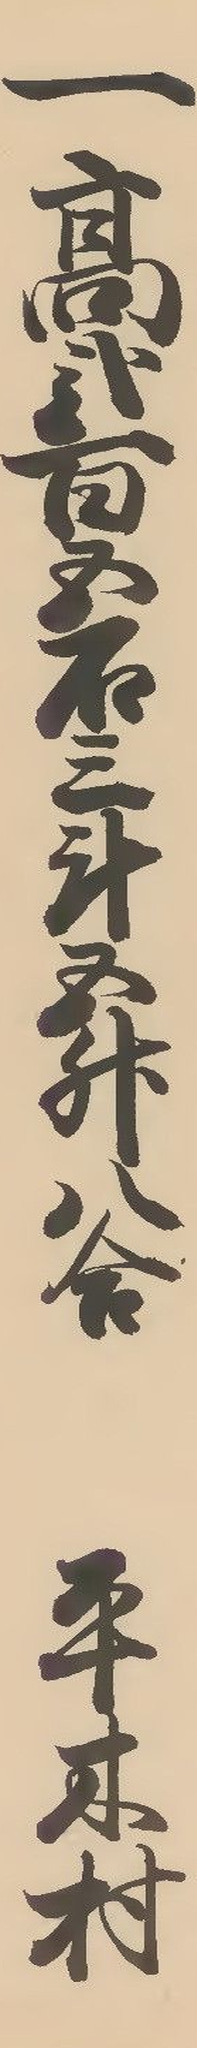一髙弐百五石三斗五升八合平木村

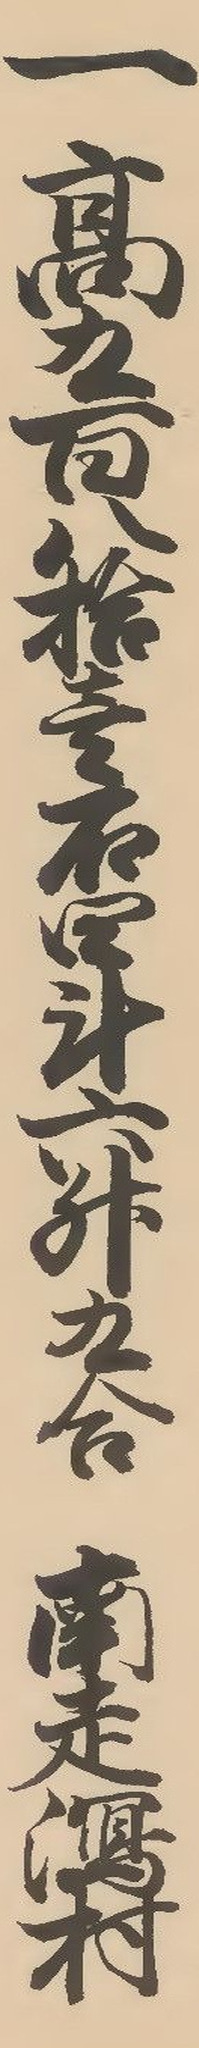一髙九百八拾壱石四斗六升九合南走潟村
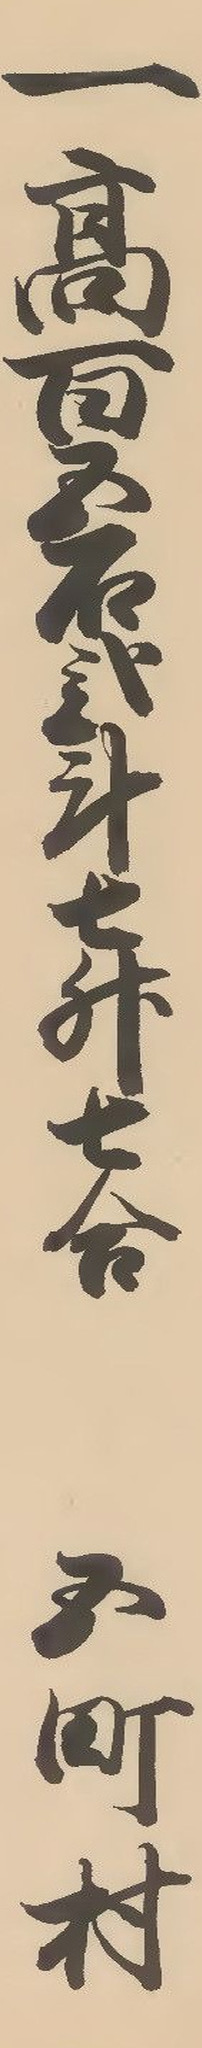一髙百五石弐斗七升七合五町村
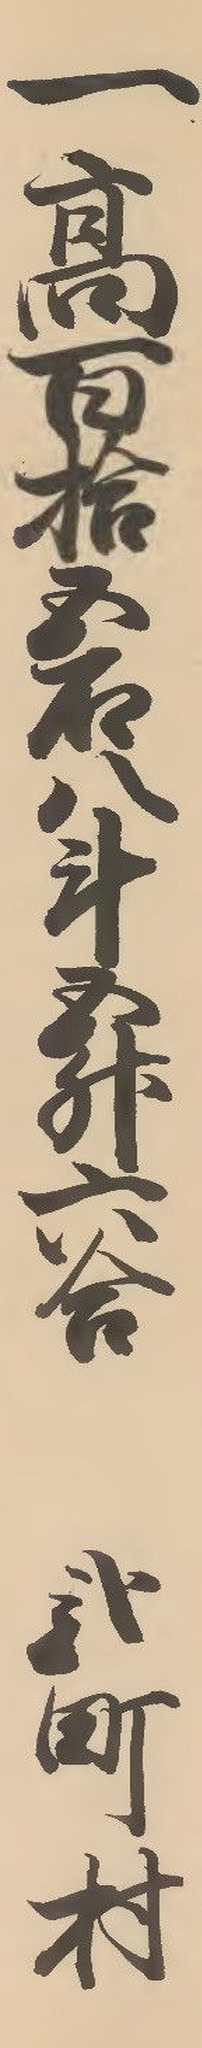一髙百拾五石八斗五升六合弐町村
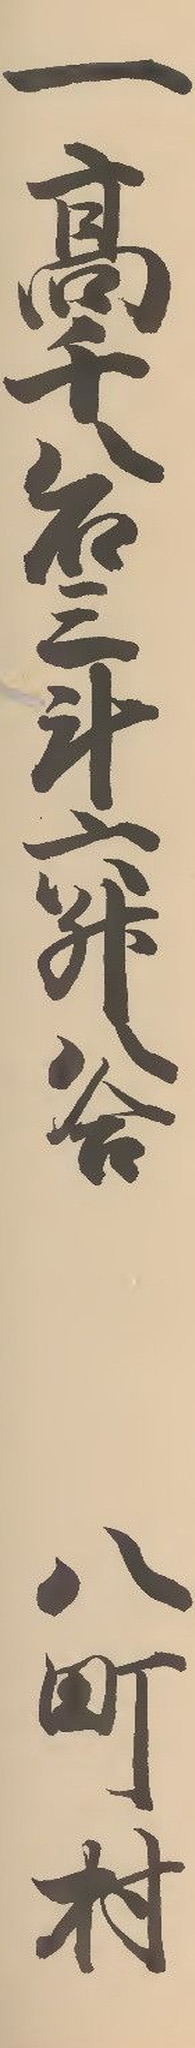一髙千八石三斗六升八合八町村
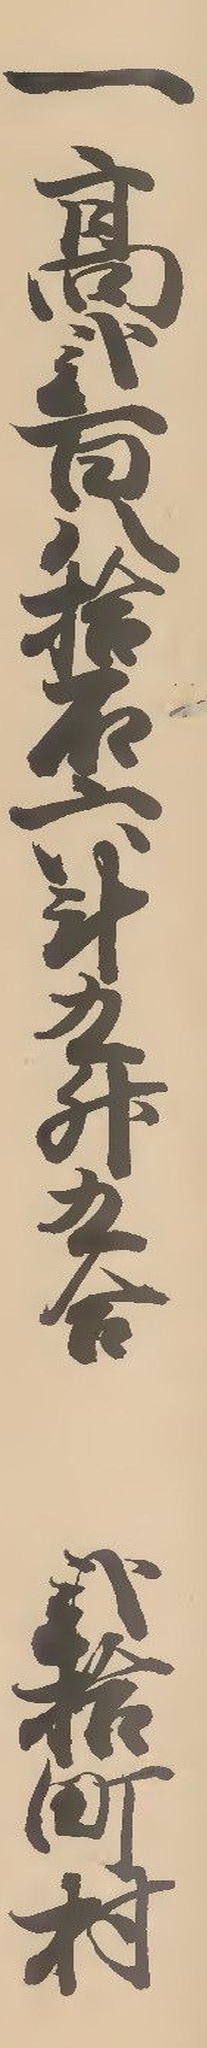一髙弐百八拾石六斗九升九合弐拾町村
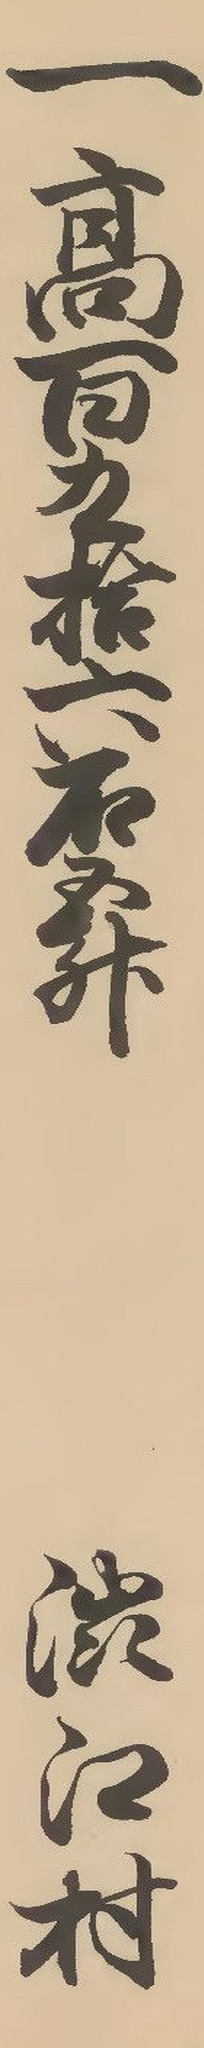一髙百九拾六石五升渋江村
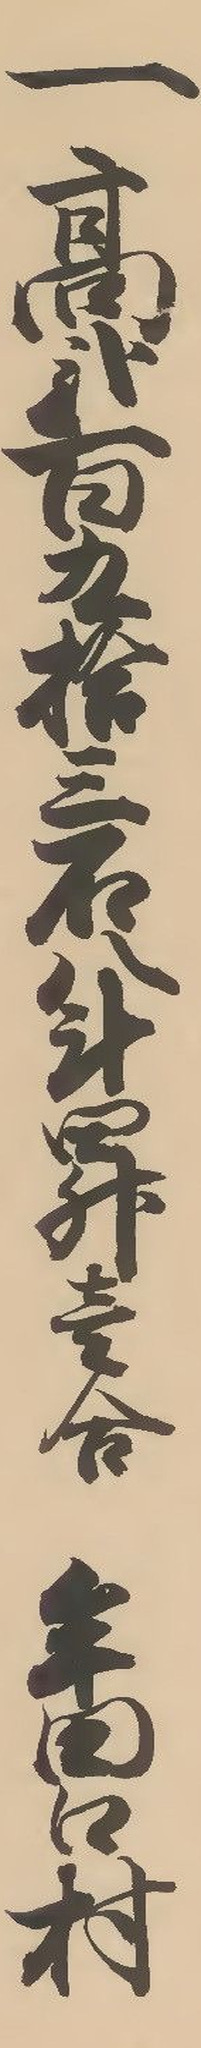一髙弐百九拾三石八斗四升壱合牟田口村
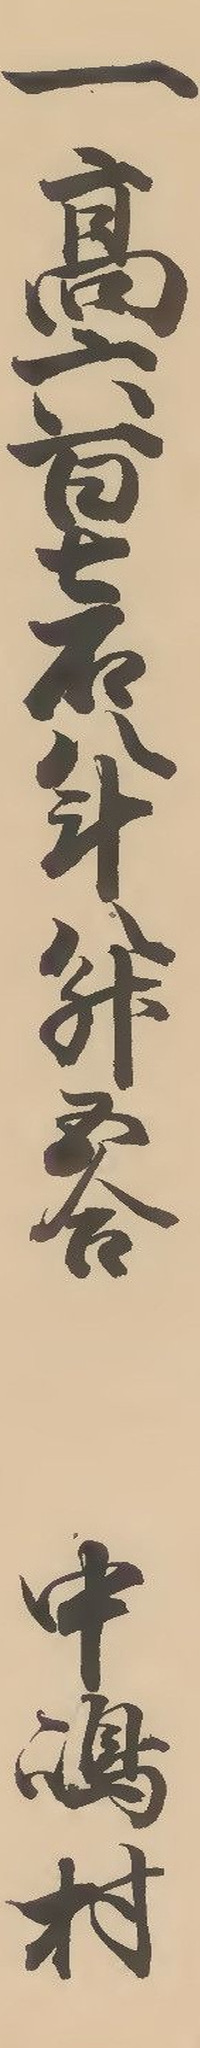一髙六百七石八斗八升五合中嶋村

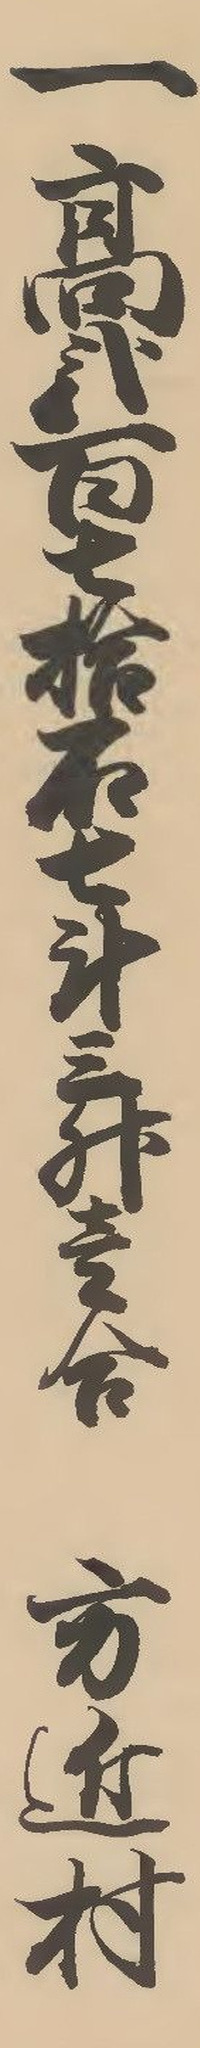一髙弐百七拾石七斗三升壱合方今村
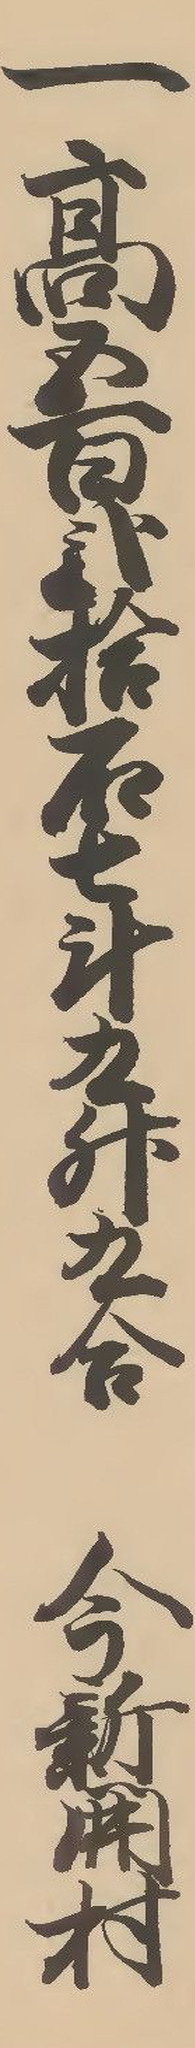一髙五百弐拾石七斗九升九合今新開村
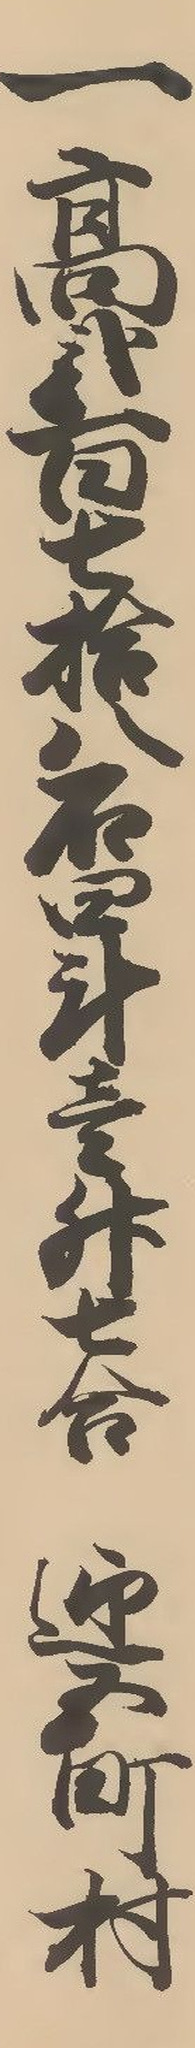一髙弐百七拾八石四斗壱升七合迎五町村
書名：肥後国郷帳
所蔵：国立公文書館 National Archives of Japan
